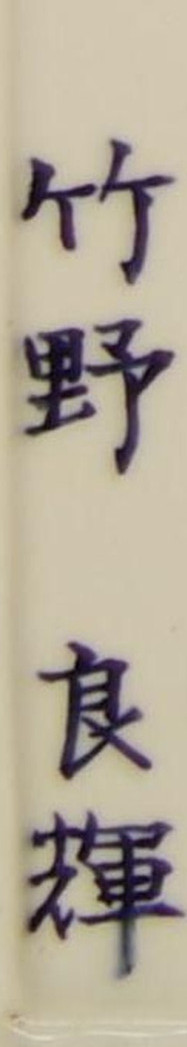竹野良輝

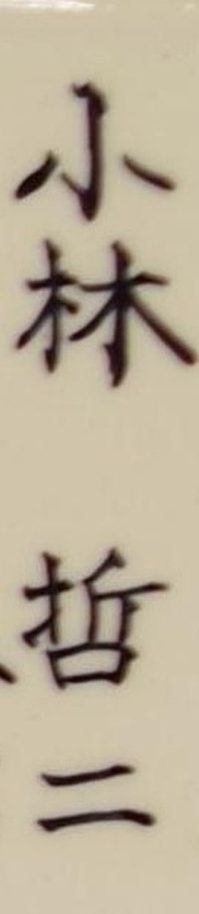小林哲二
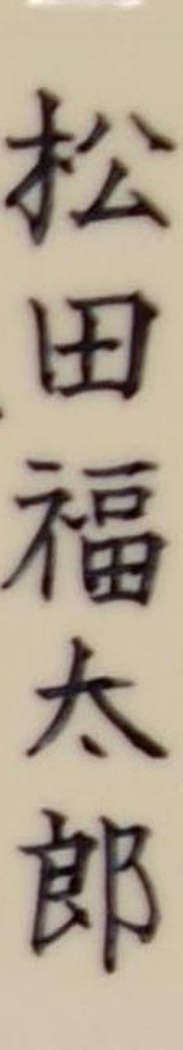松田福太郎
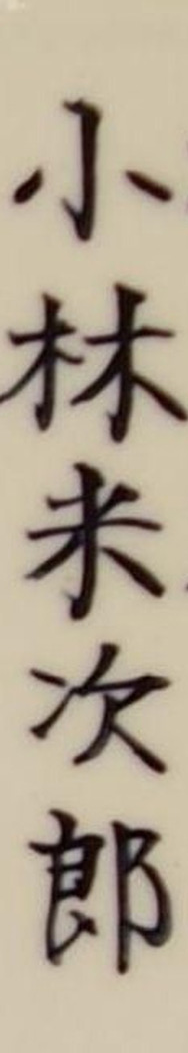小林米次郎
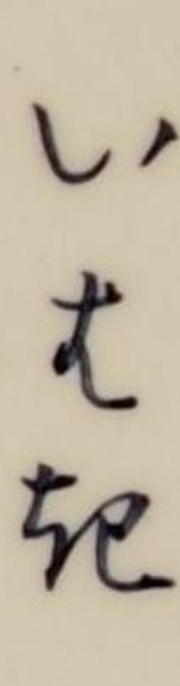いはき
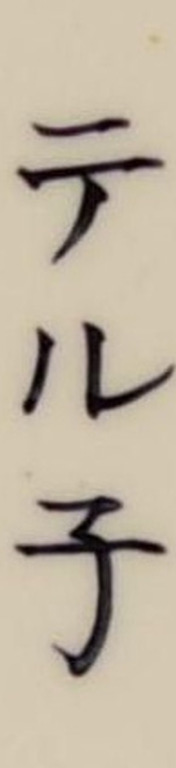テル子
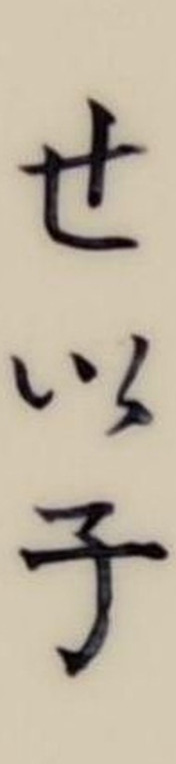せい子
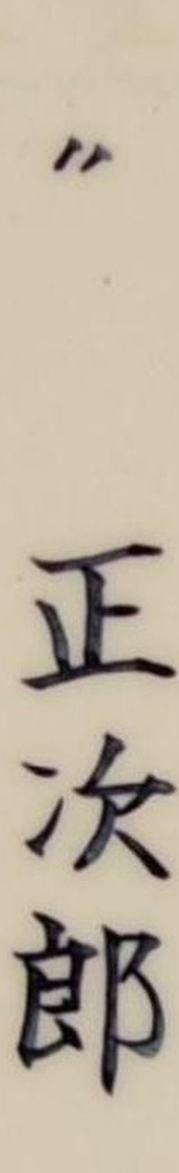正次郎
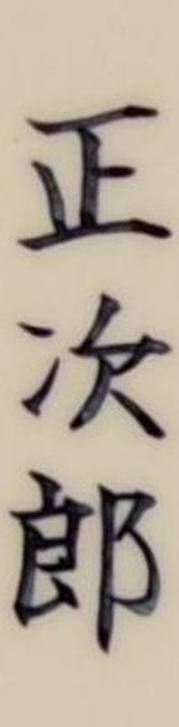正次郎
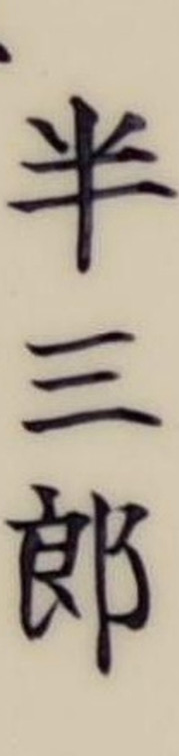半三郎
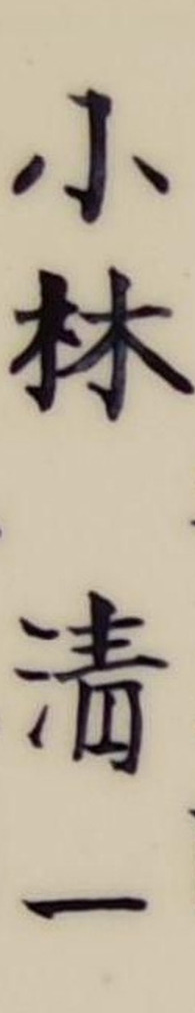小林清一
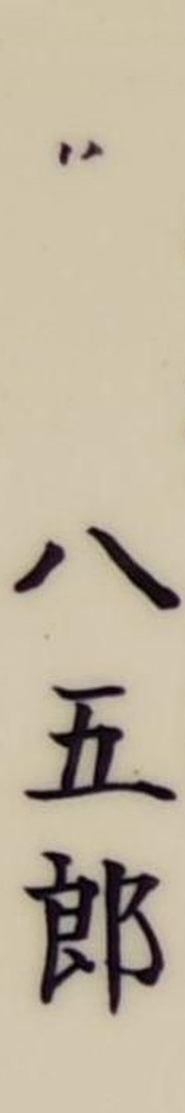八五郎
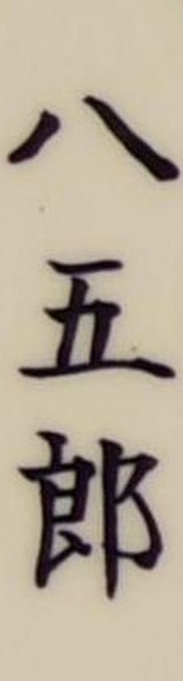八五郎
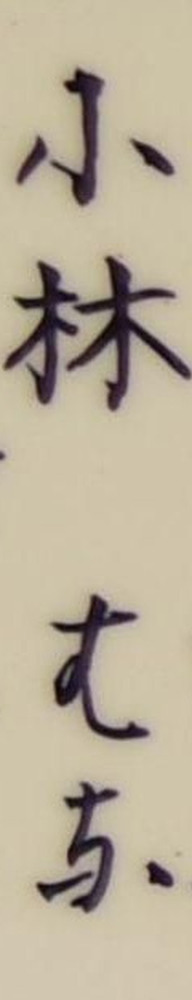小林はな
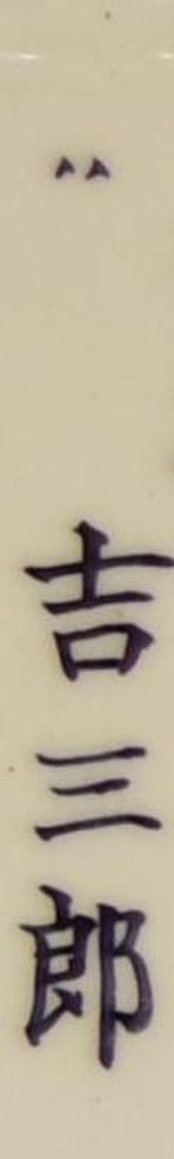吉三郎
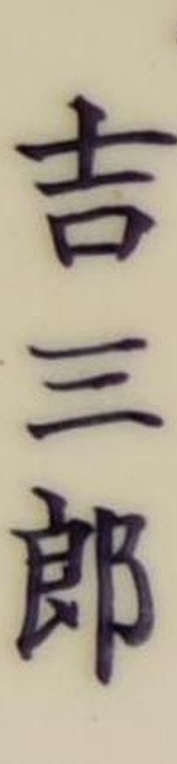吉三郎
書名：A~D
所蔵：koyasan kongobuji
